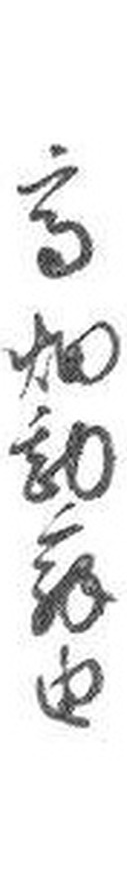高畑勘解由
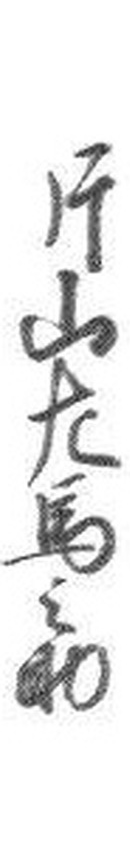片山左馬之助
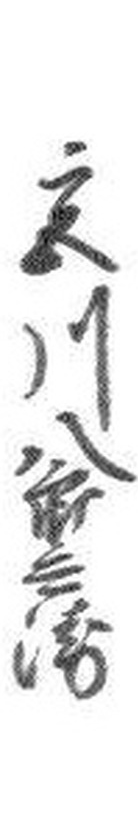宮川八郎兵衛
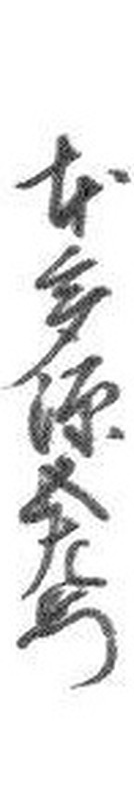本多源五左衛門
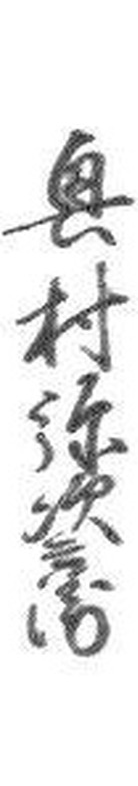奥村弥次兵衛
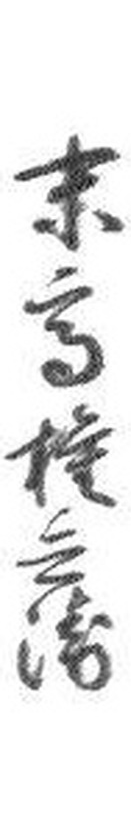末高権兵衛
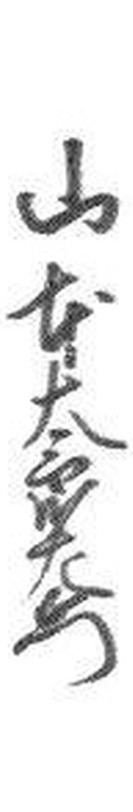山本太郎左衛門
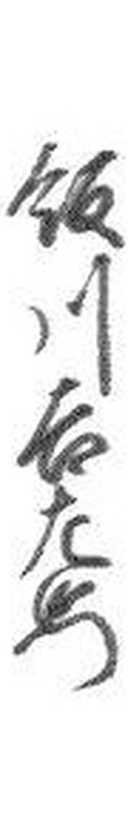飯川吉左衛門
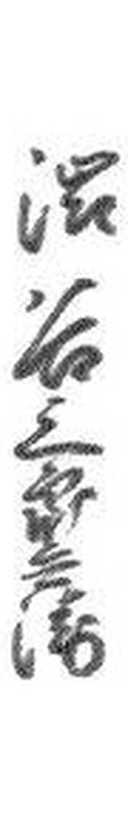岡谷三郎兵衛

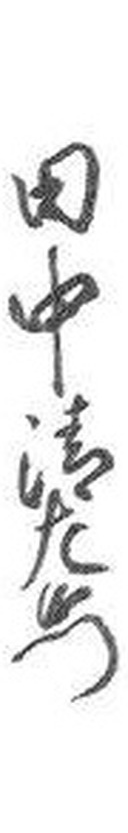田中清左衛門
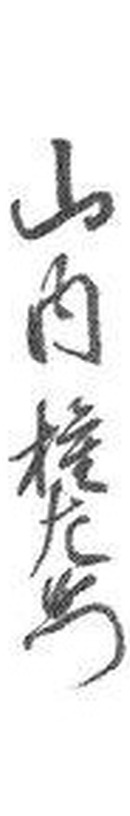山内権左衛門
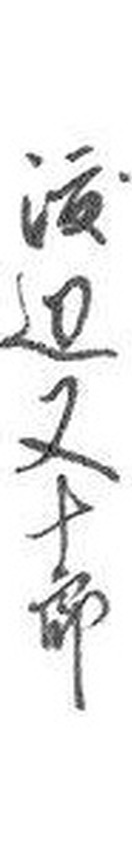渡辺又十郎
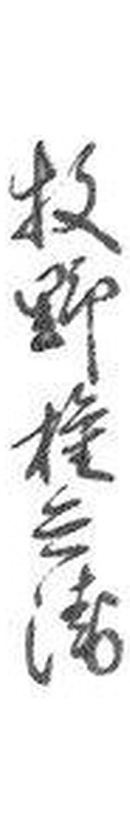牧野権兵衛
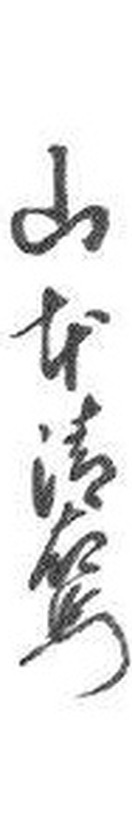山本清右衛門
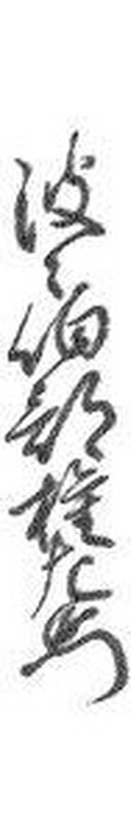波々伯部権左衛門
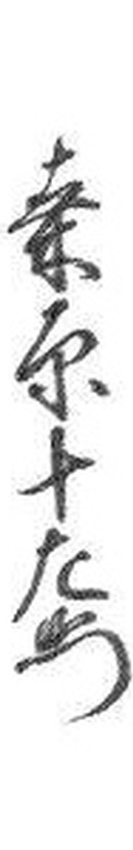桑原十左衛門
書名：家譜 四 忠昌公 従寛永七年到正保四年
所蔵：福井県文書館 Fukui Prefectural Archives
